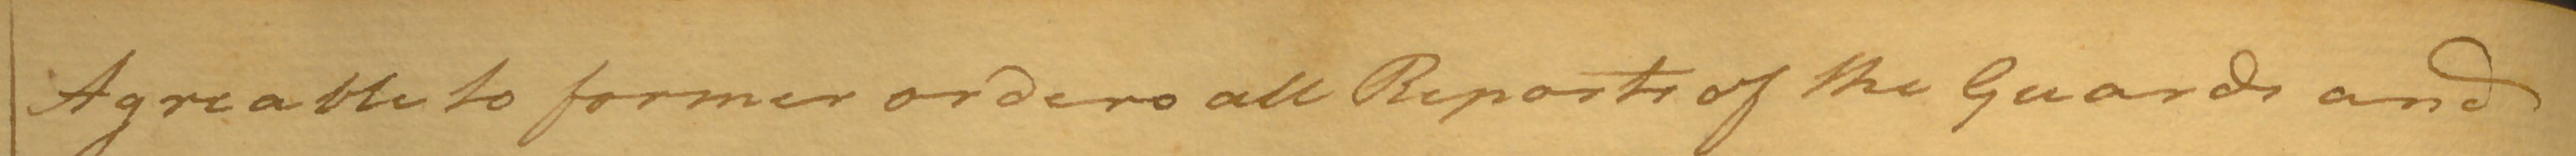Agreable to former orders all Reports of the Guards and
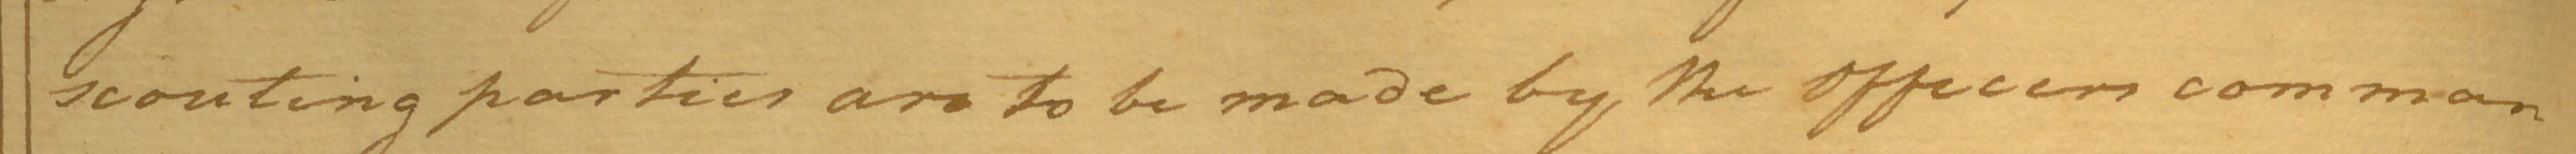scouting parties are to be made by the officers comman
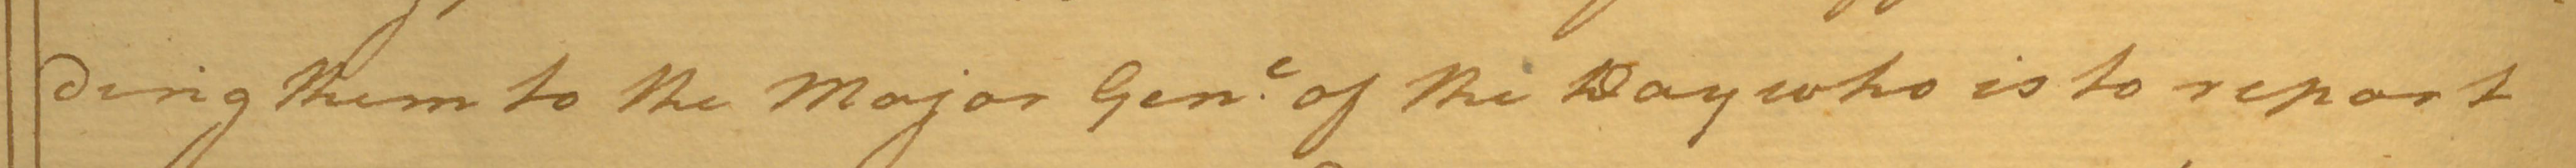ding them to the Major Gen^l. of the Day who is to report
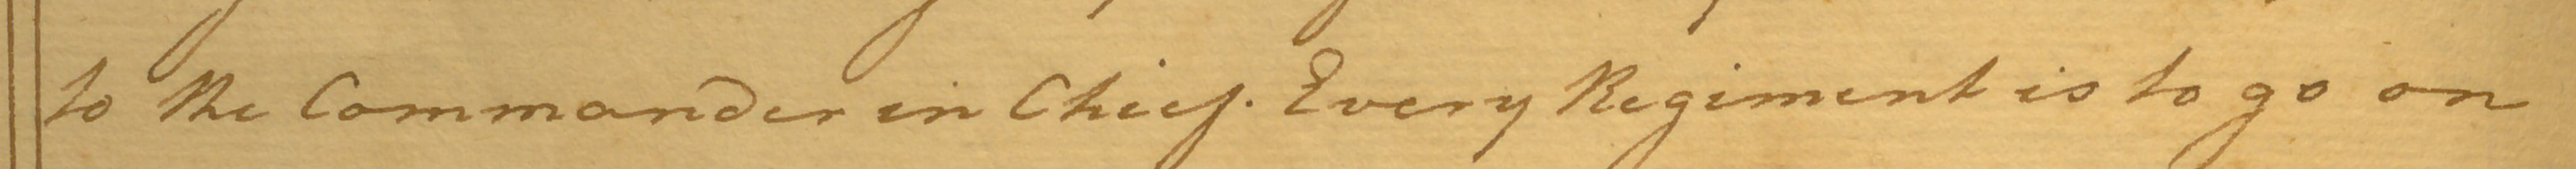to the Commander in Chief. Every Regiment is to go on
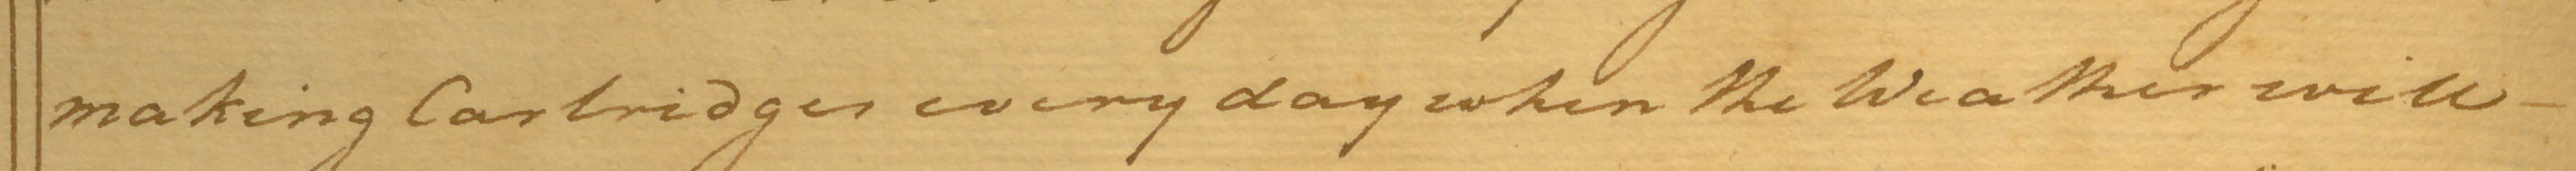making Cartridges every day when the Weather will
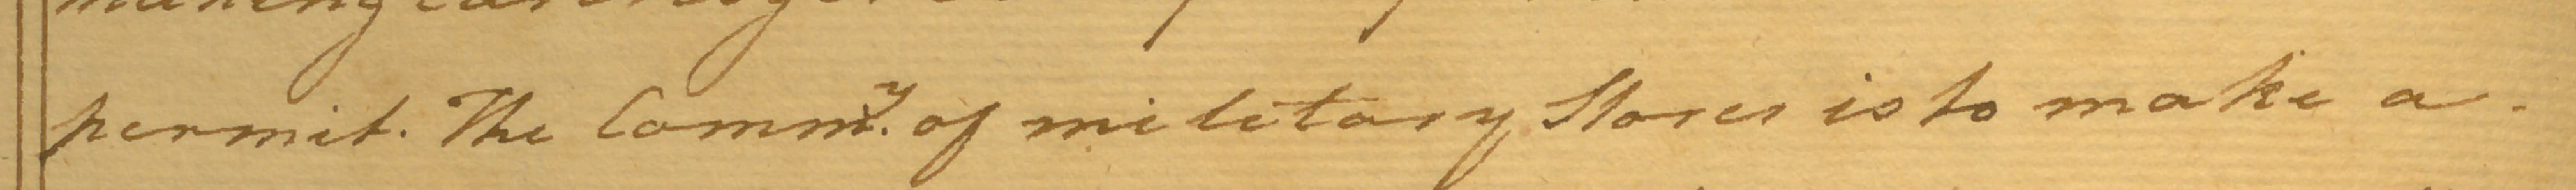permit. The Comm^y. of military stores is to make a
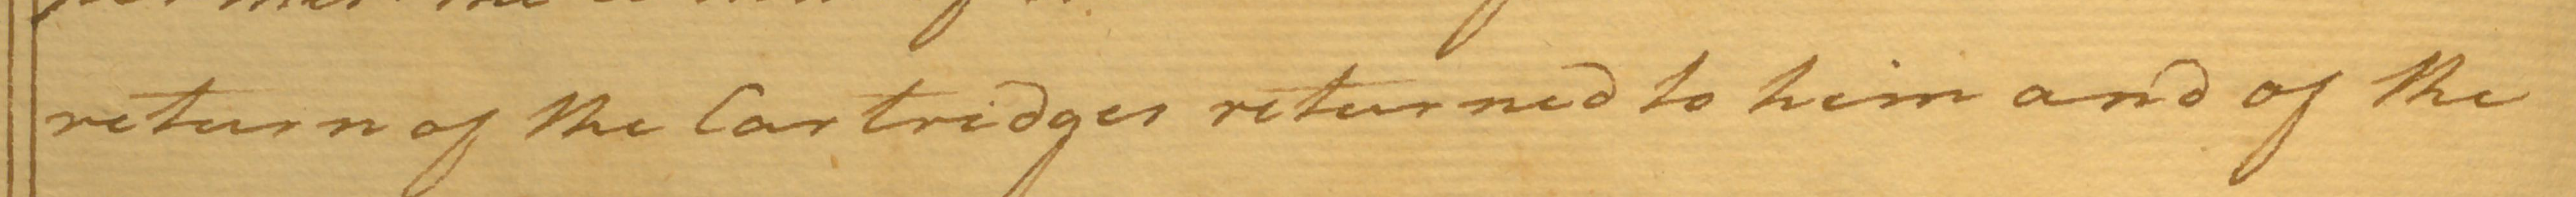return of the Cartridges returned to him and of the
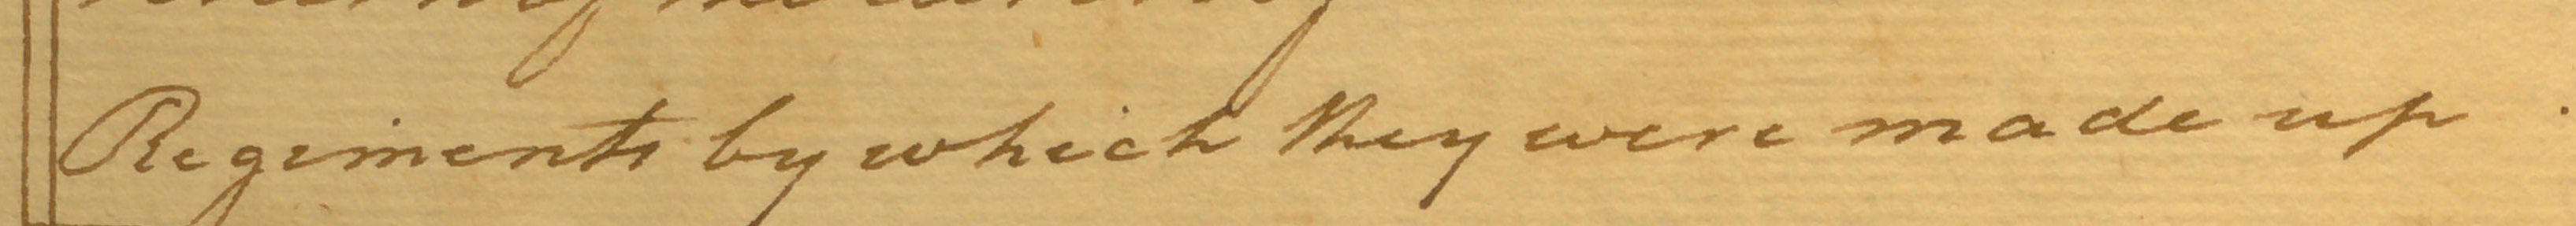Regiments by which they were made up
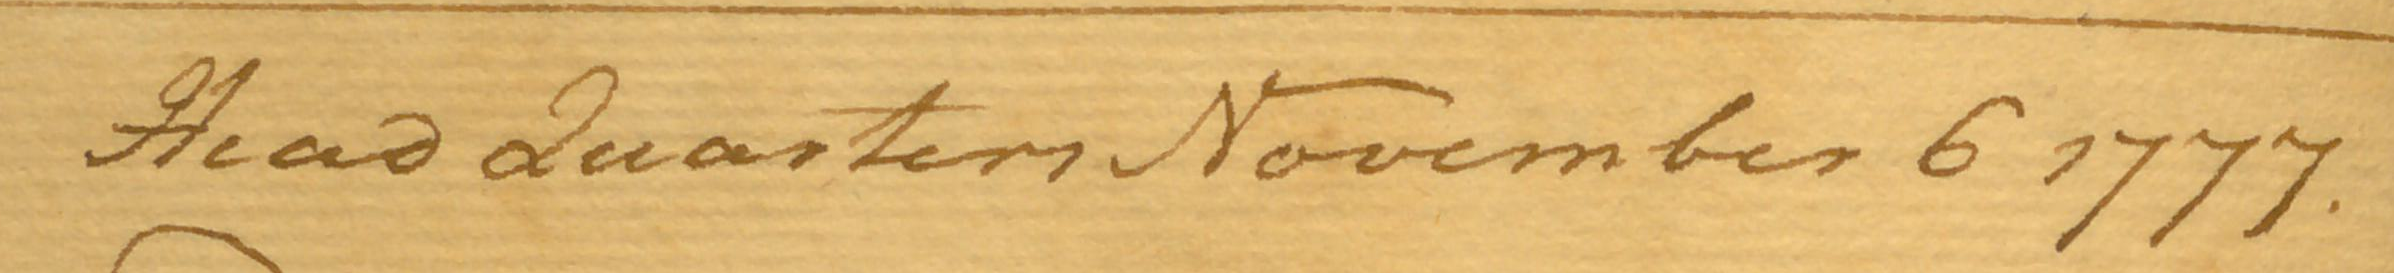Head Quarters November 6 1777.
